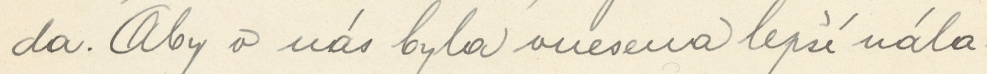da. Aby v nás byla vnesena lepší nála-
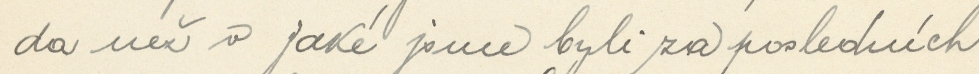da než v jaké jsme byli za posledních
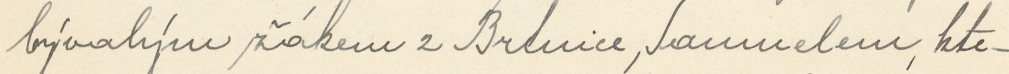bývalým žákem z Brtnice, Samuelem, kte-
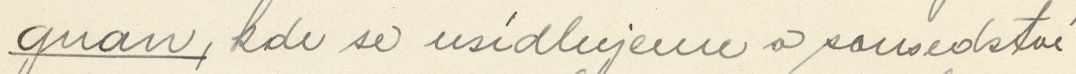gnan, kde se usídlujeme v sousedství
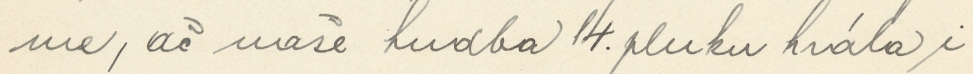me, ač naše hudba 14. pluku hrála i
